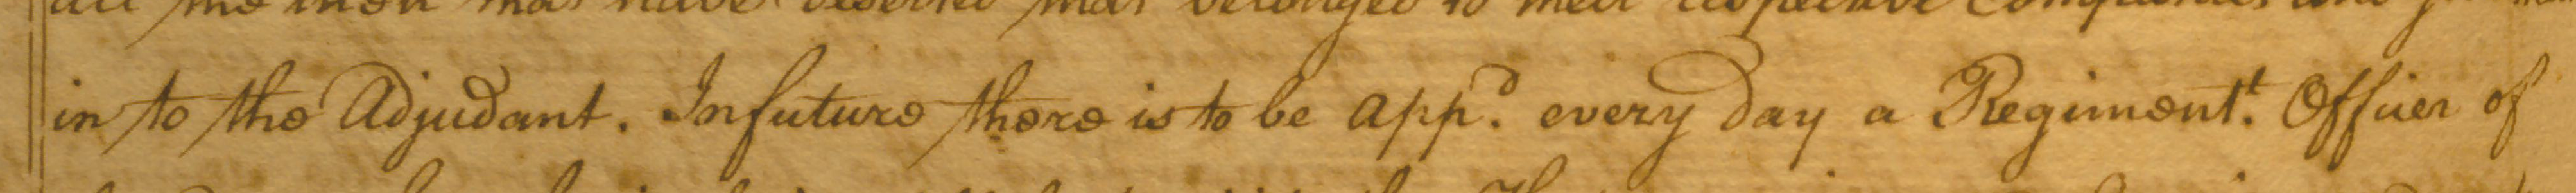in to the Adjudant. In future there is to be app^d. every day a Regiment^l. Officer of
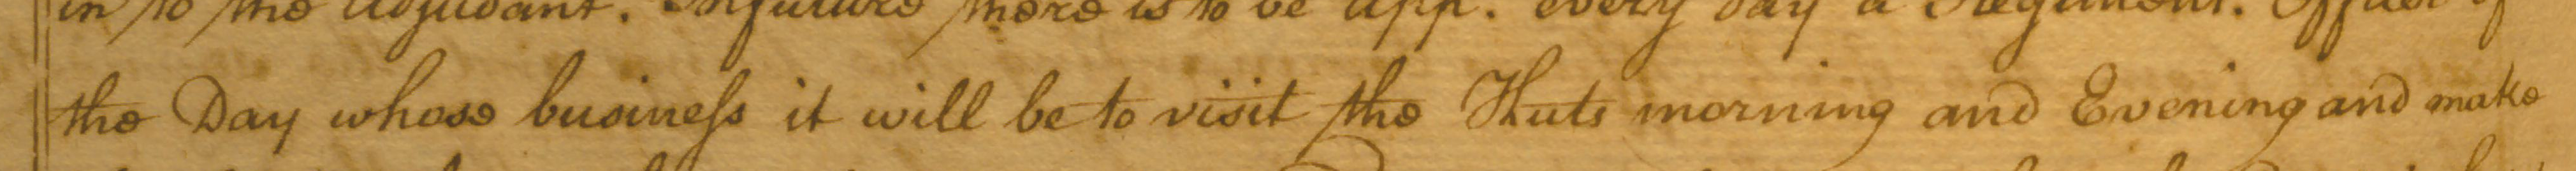the Day whose business it will be to visit the Huts morning and Evening and make
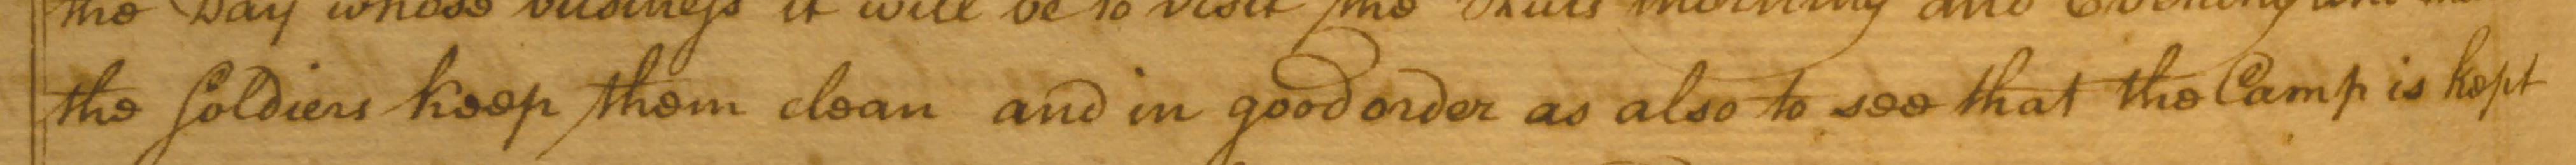the soldiers keep them clean and in good order as also to see that the Camp is kept
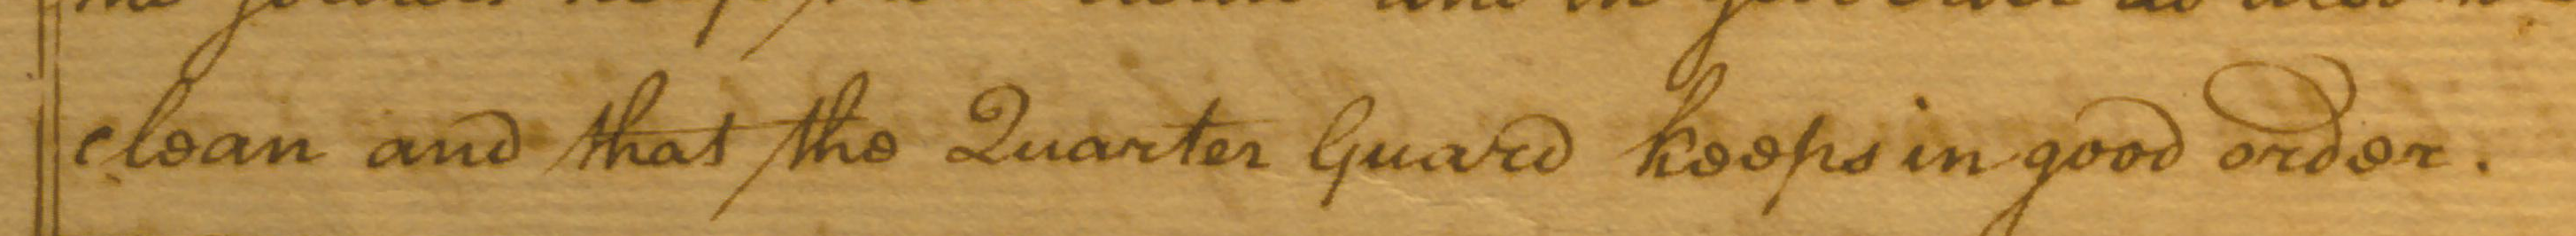clean and that the Quarter Guard keeps in good order.
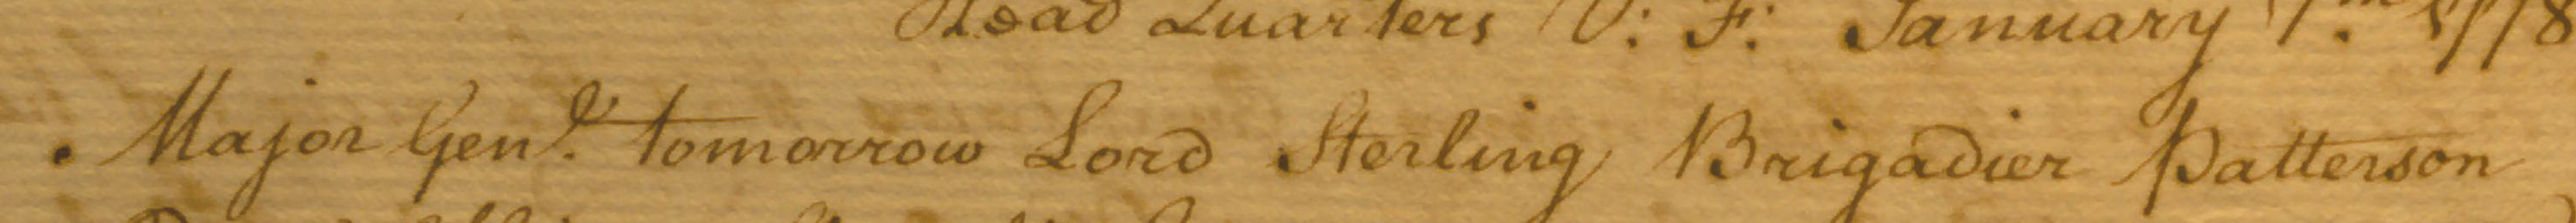Major Gen^l. tomorrow Lord Sterling Brigadier Patterson
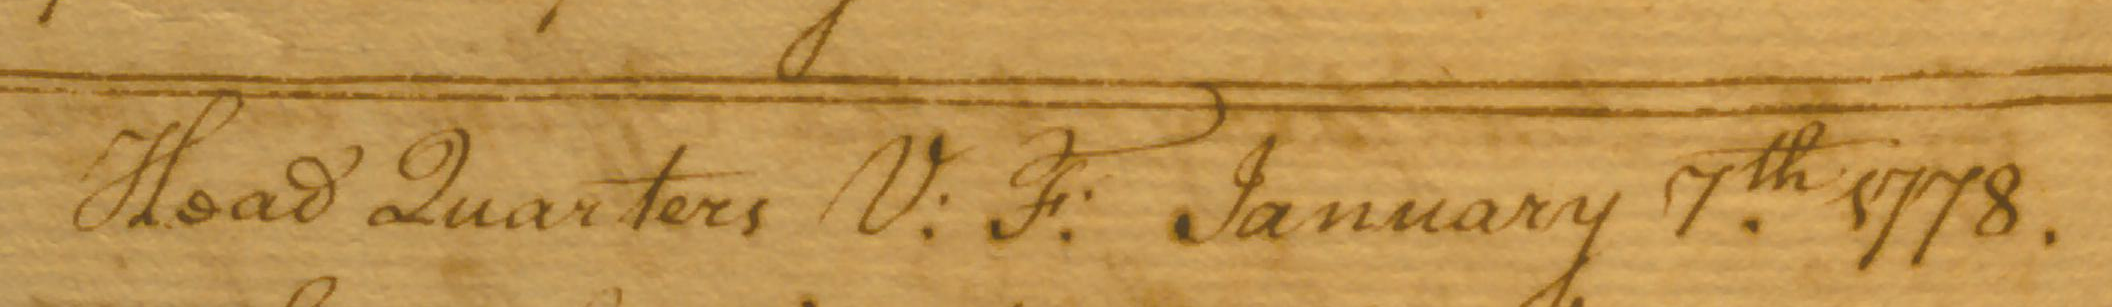Head Quarters V: F: January 7^th. 1778.
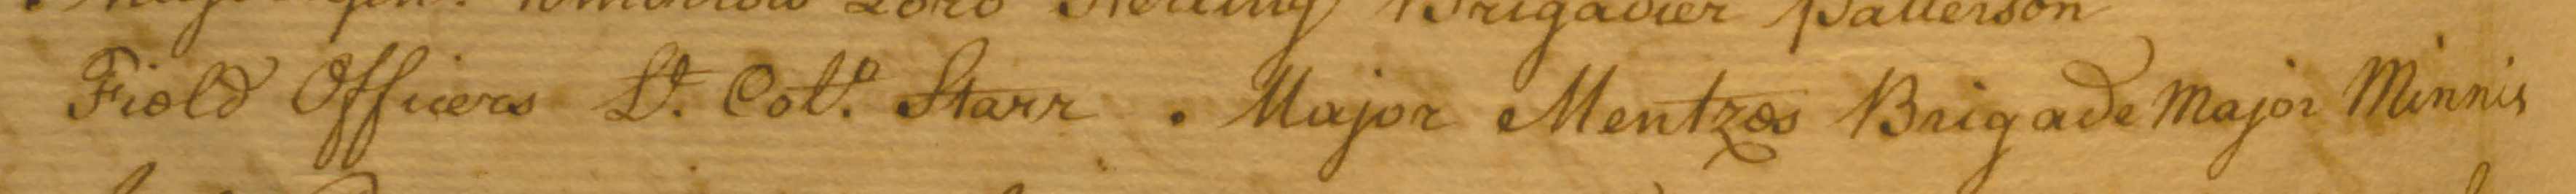Field Officers L^t. Col^o. Starr. Major Mentzes Brigade Major Minnis
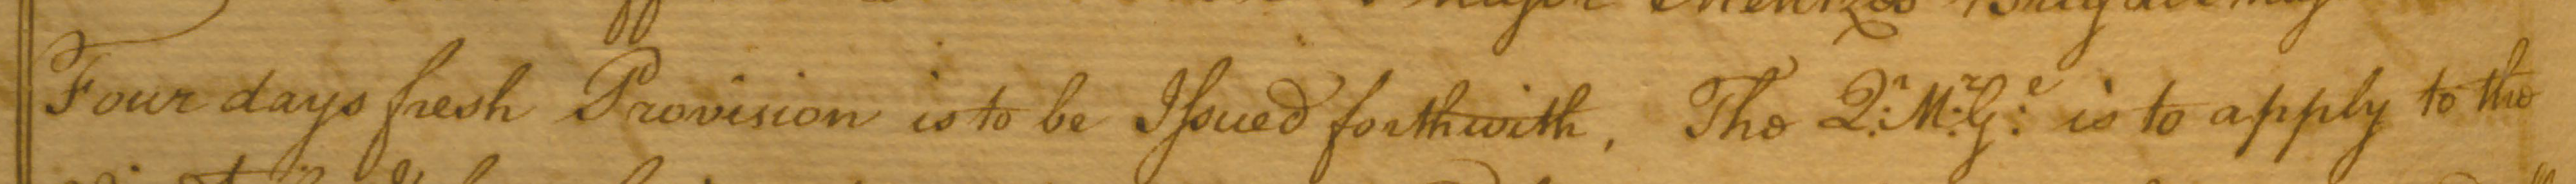Four days fresh Provision is to be Issued forthwith. The Q^r: M^r: G^l: is to apply to the
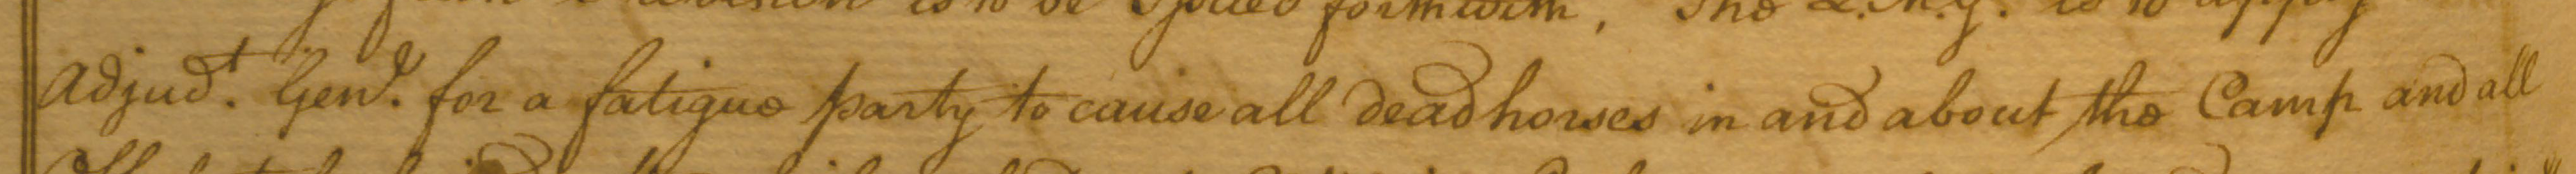Adjud^t. Gen^l. for a fatigue party to cause all dead horses in and about the Camp and all
